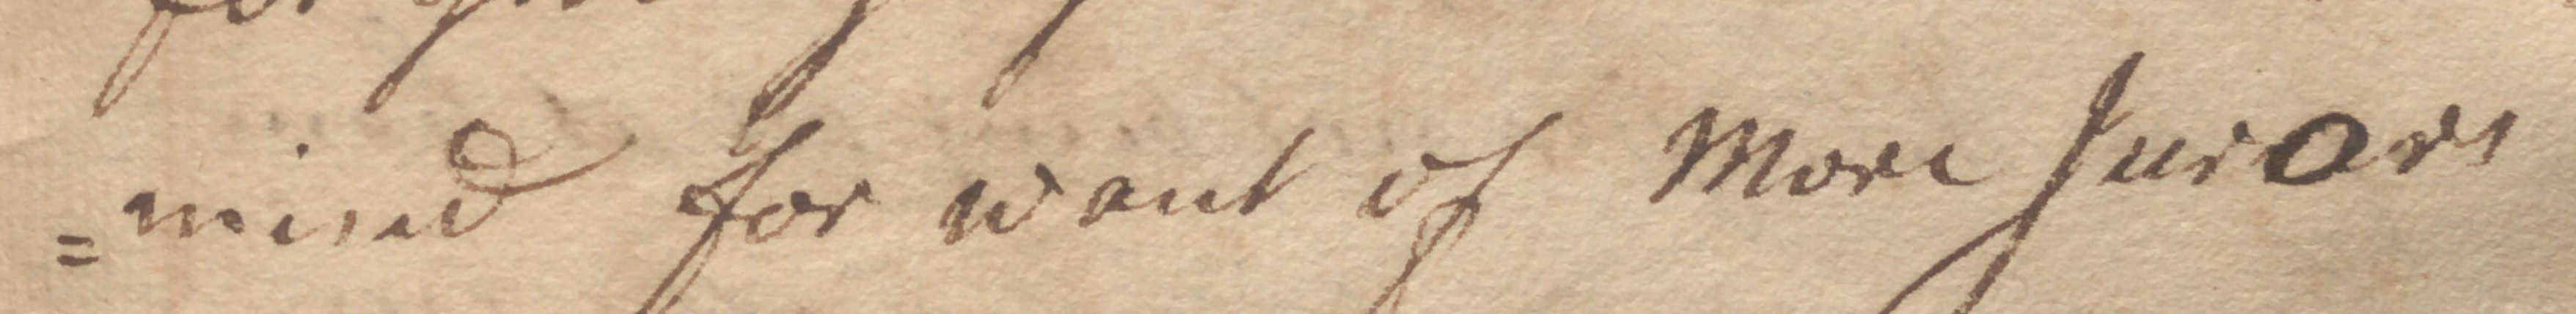-mised for want of More Jurors
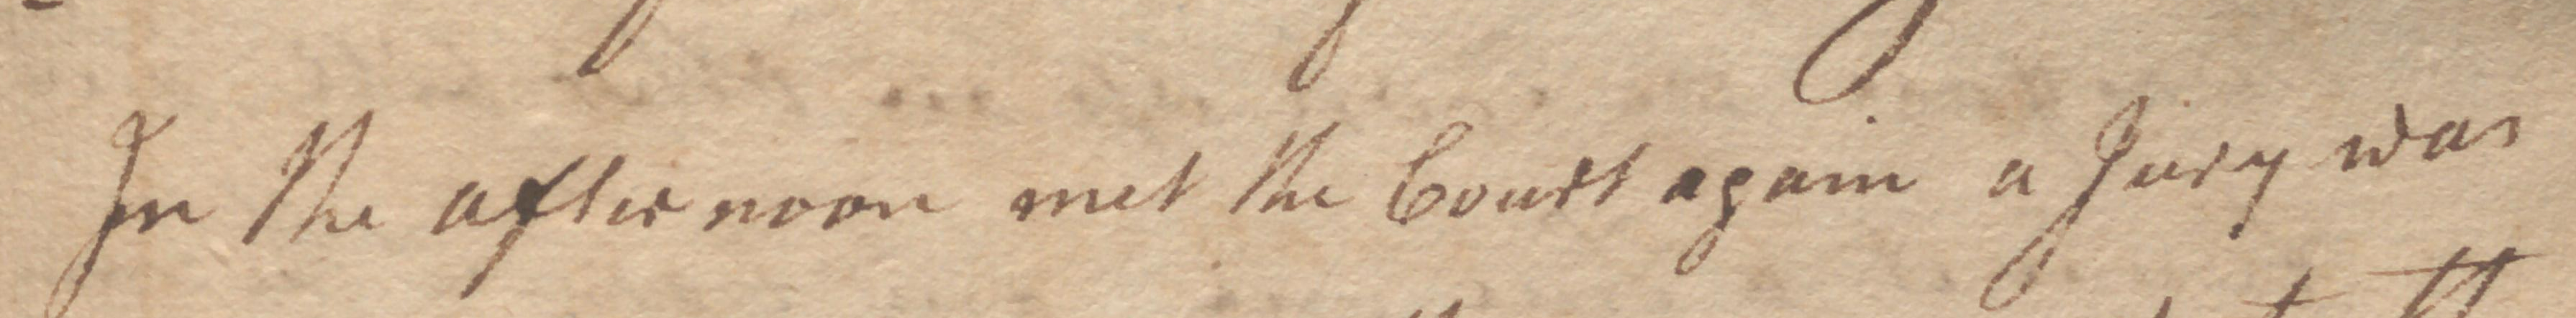In the afternoon met the Court again a Jury was
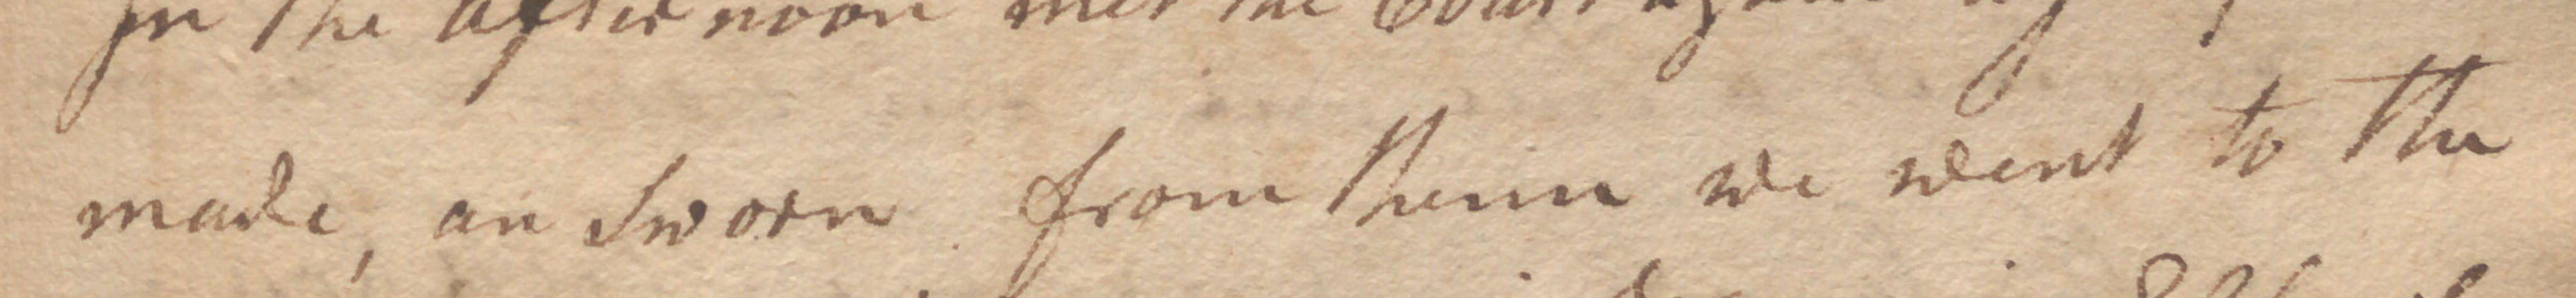made, an sworn from thence we went to the
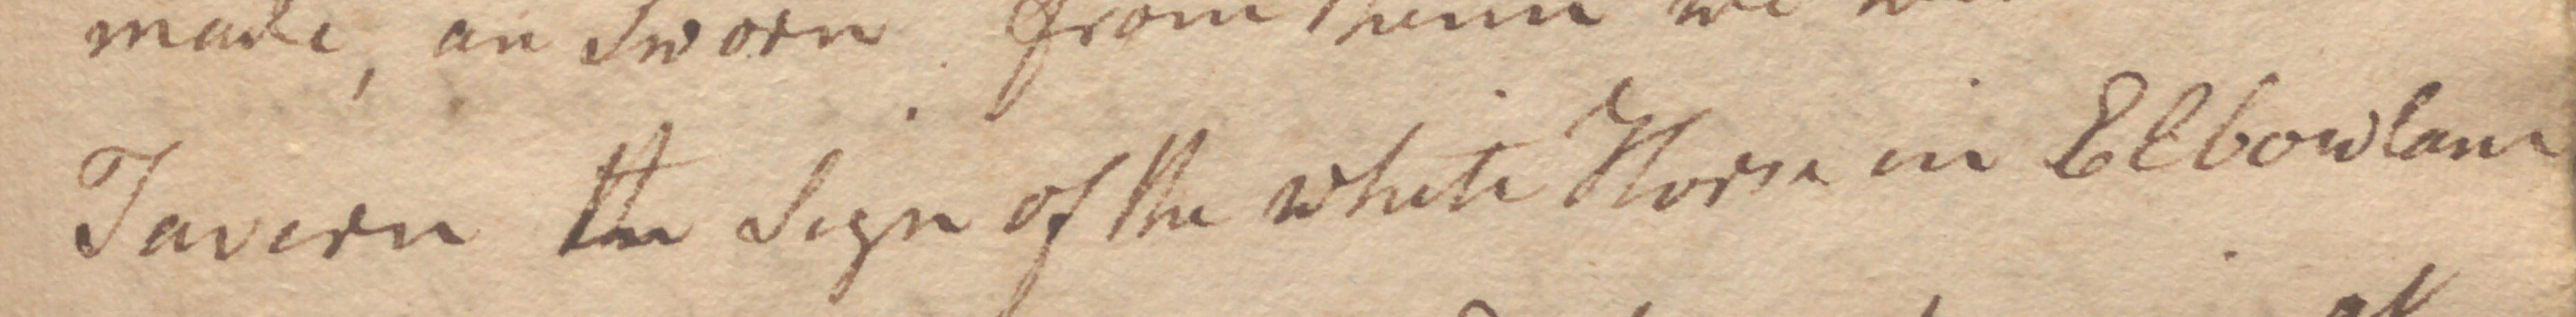Tavern the sign of the white Horse in Elbowlan
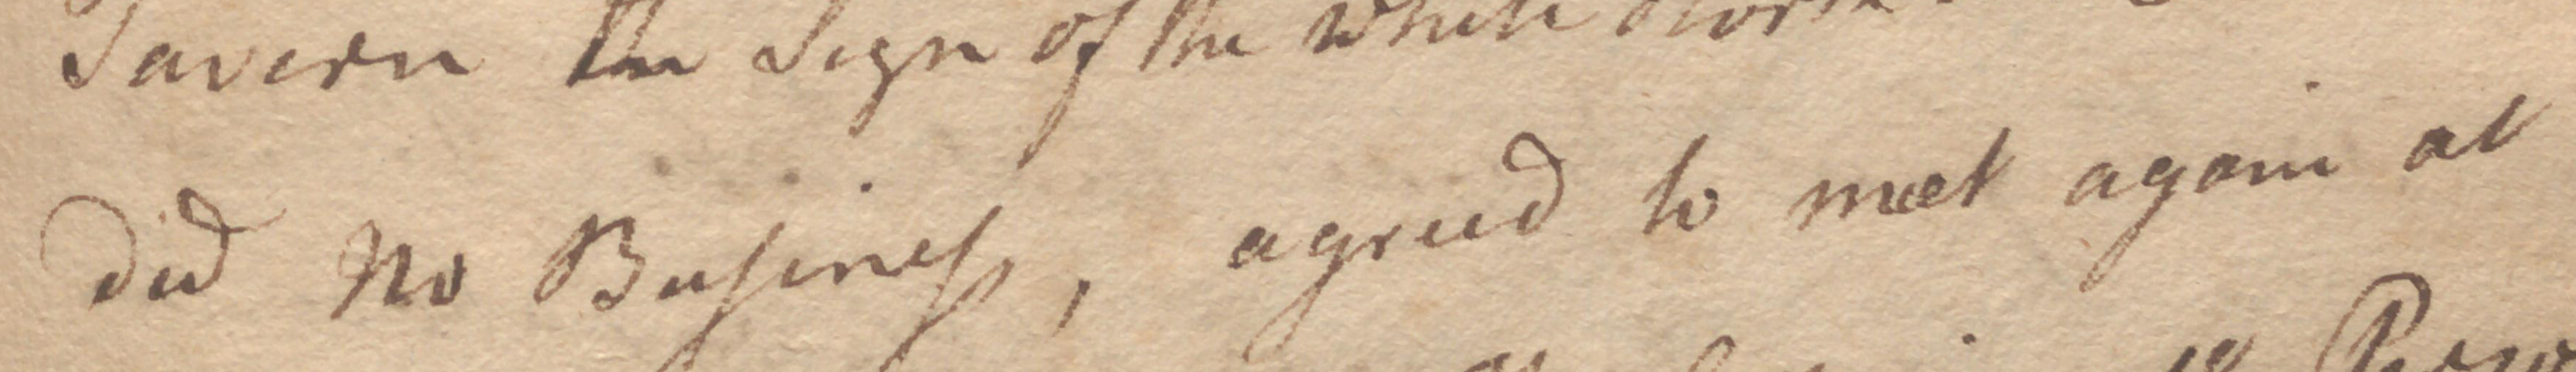did no Business, agreed to meet again at
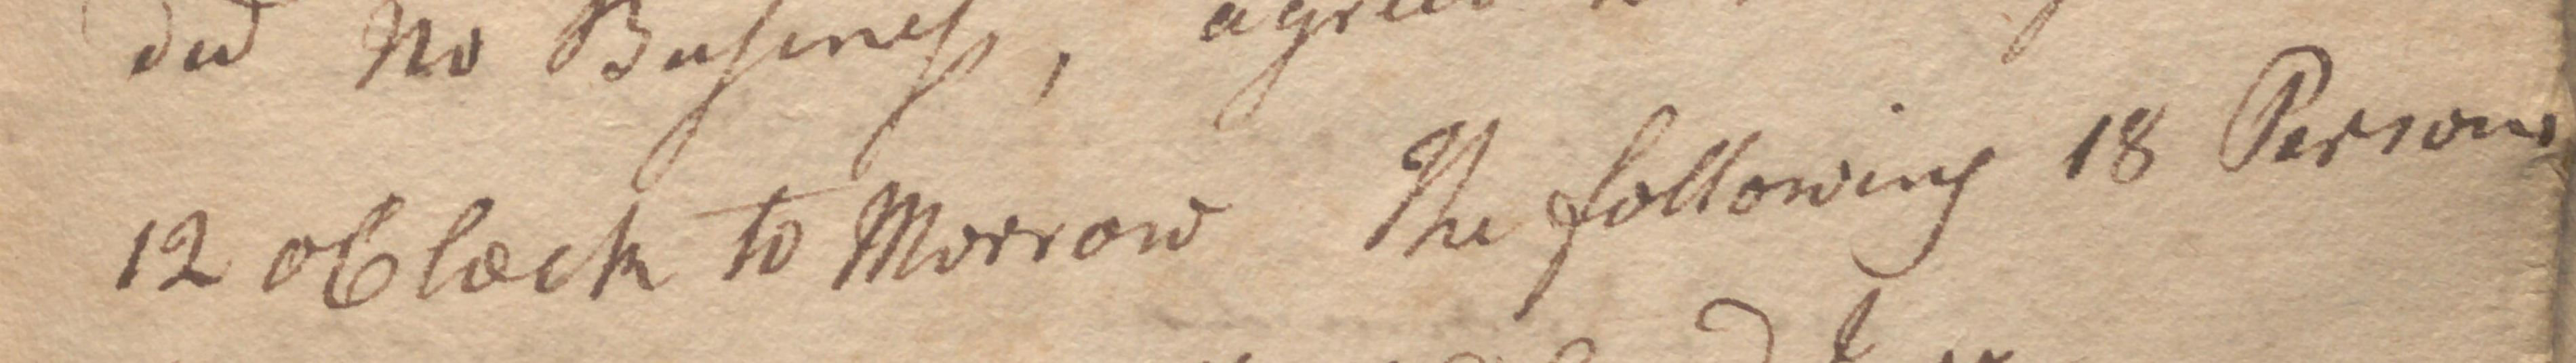12 oClock to Morrow The following 18 Person
